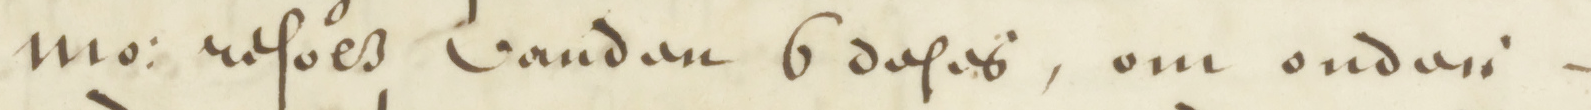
Mo: resol vanden 6 deses, om onder
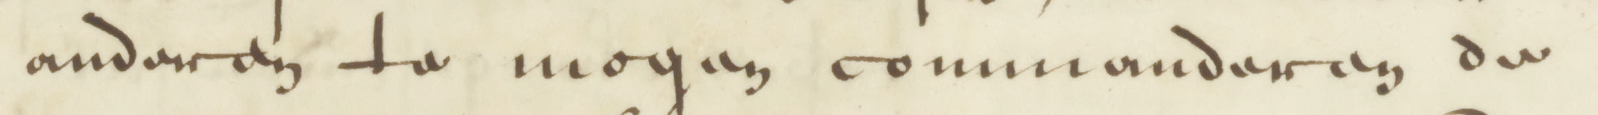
anderen te mogen commanderen de
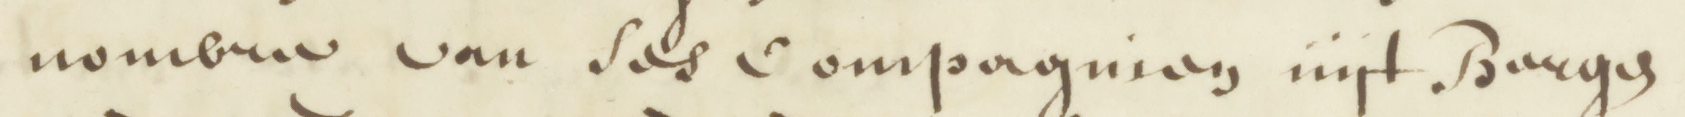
nombre van Ses Compagnien uijt Bergen
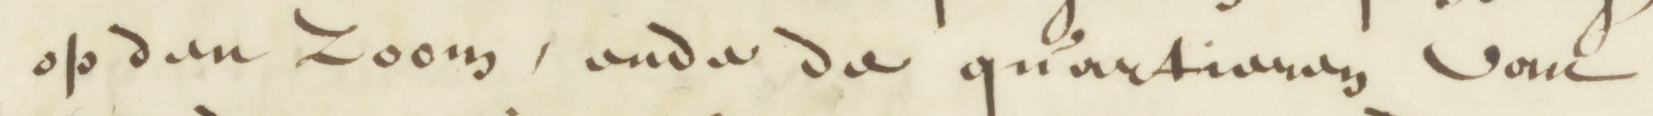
op den Zoom, ende de quartieren van
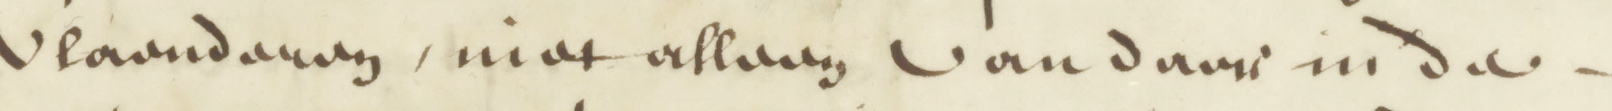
Vlaenderen, niet alleen van daer in de
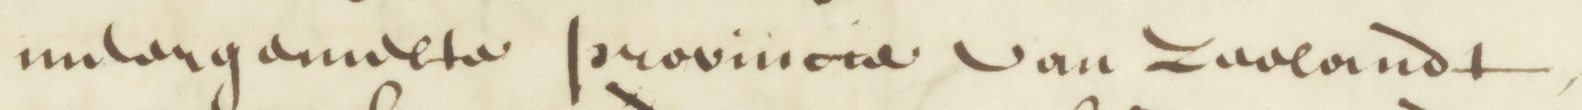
meergemelte provincie van Zeelandt,
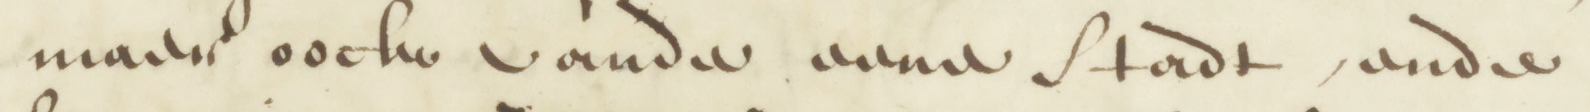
maer oock vande eene Stadt, ende
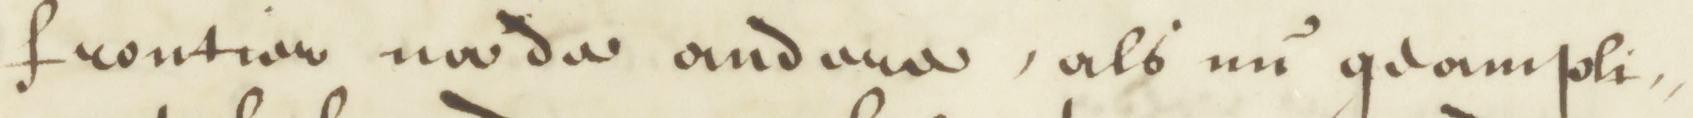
frontier na de andere, als nu geampli„
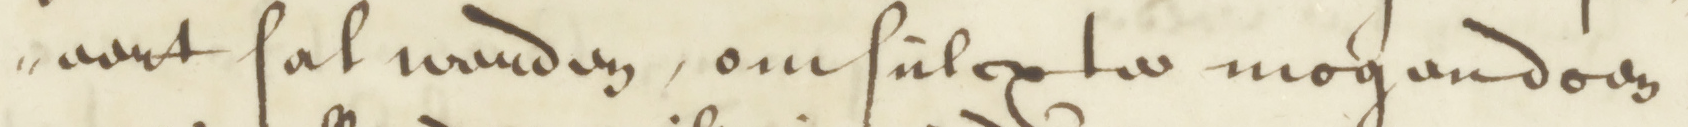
„eert sal werden, om sulcx te mogen doen
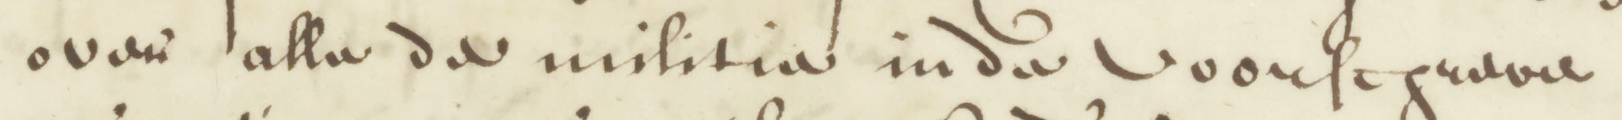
over alle de militie inde voorschreve
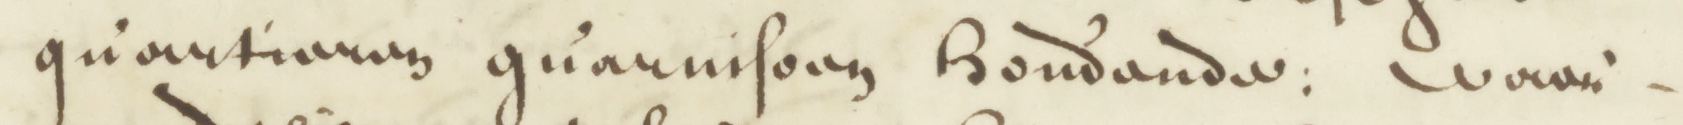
quartieren quarnisoen houdende: waer
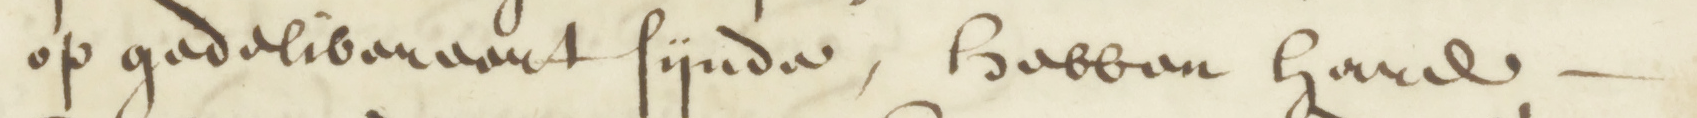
op gedelibereert sijnde, hebben hare -
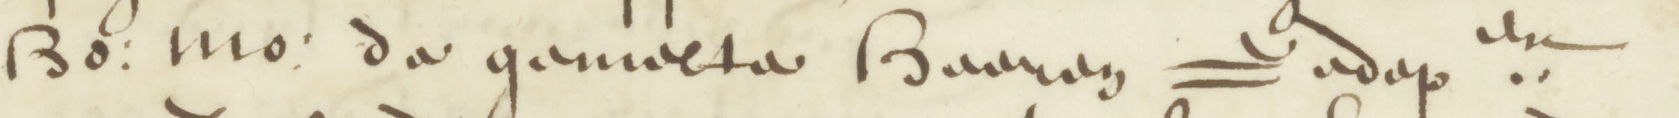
Ho: Mo: de gemelte Heeren Gedepen
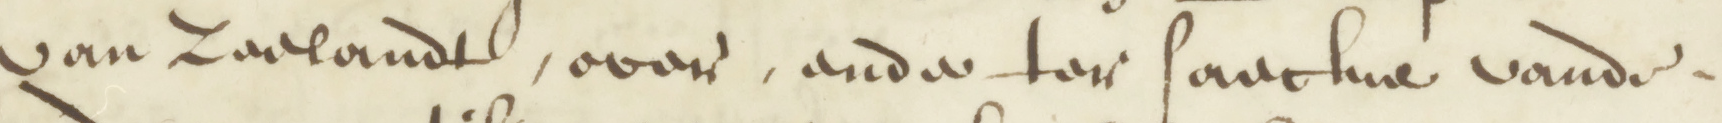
van Zeelandt, over, ende ter saecke vande
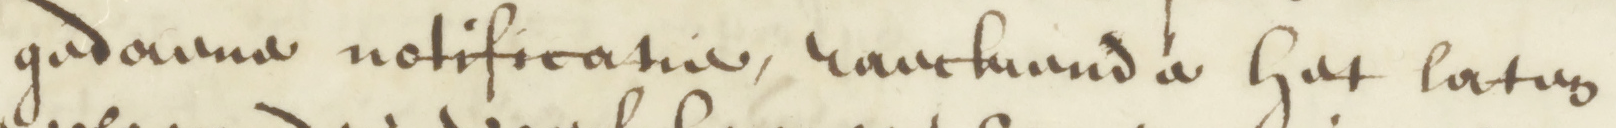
gedaene notificatie, raeckende het laten
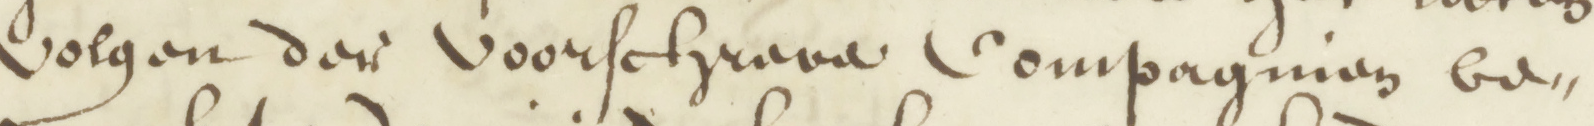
volgen der voorschreve Compagnien be„
